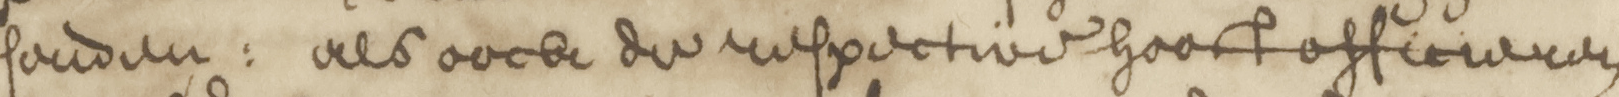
senden: als oock de respective hooft officieren
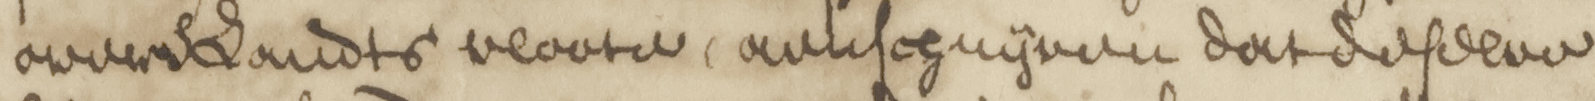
oversLandts vloote, aenschrijven dat deselve
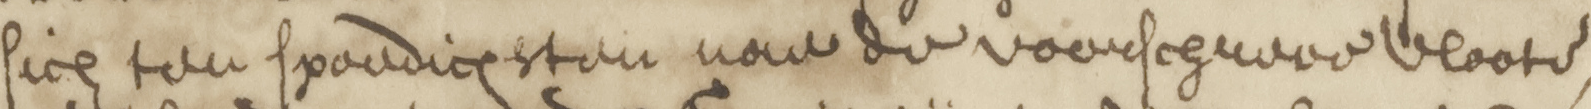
sich ten spoedichsten nae de voorschreve vloote
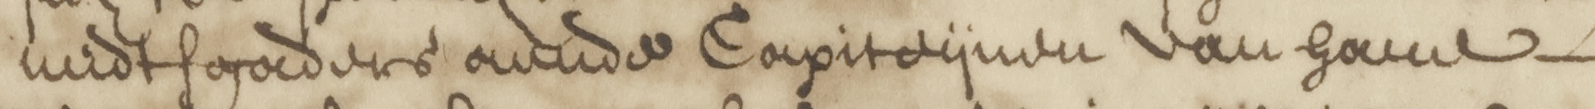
midtsgaders aende Capiteijnen van hare
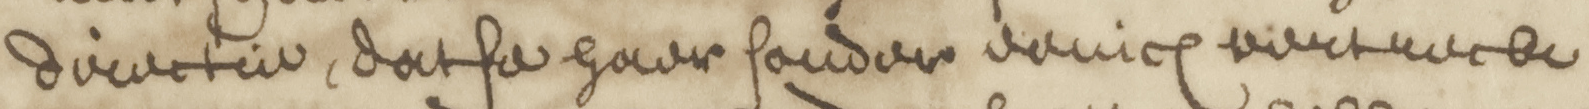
directie, datse haer sonder eenich vertreck
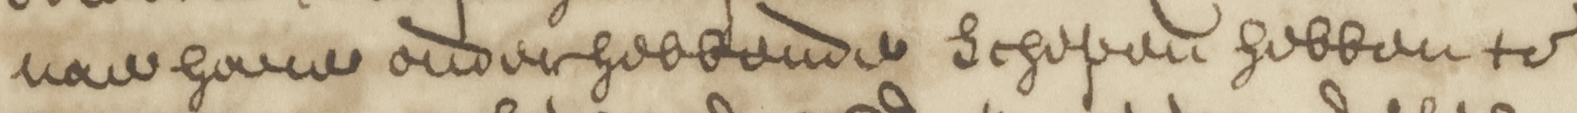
nae hare onderhebbende schepen hebben te
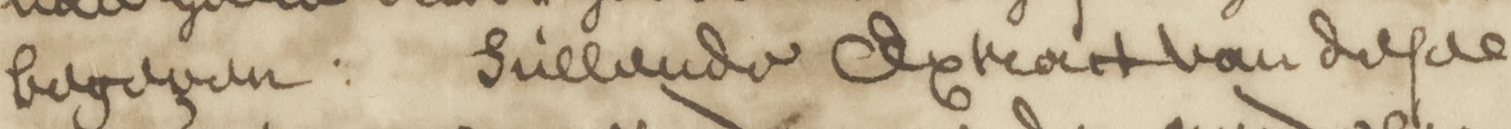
begeven: Sullende Extract van dese
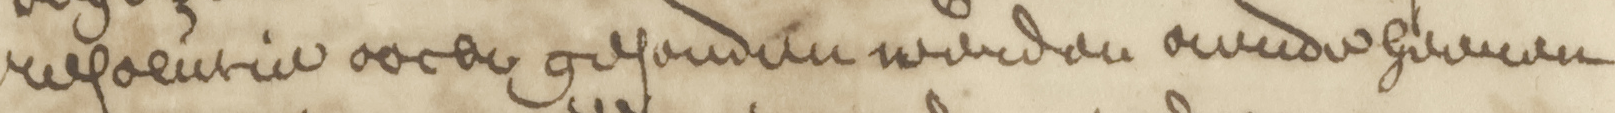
resolutie oock gesonden werden aende heeren
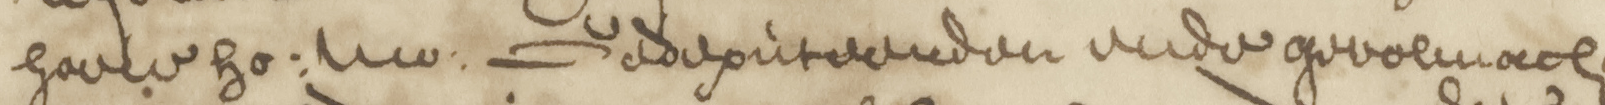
hare Ho:Mo: Gedeputeerden ende gevolmach,,
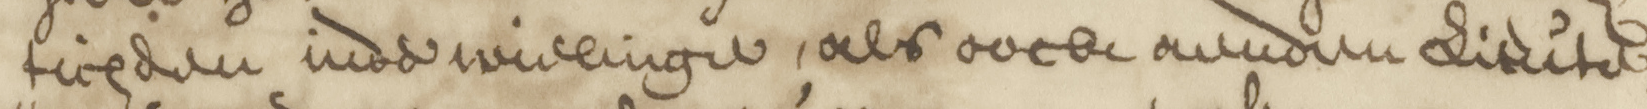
,,tichden inde wielinge, als oock aenden Lieute,,
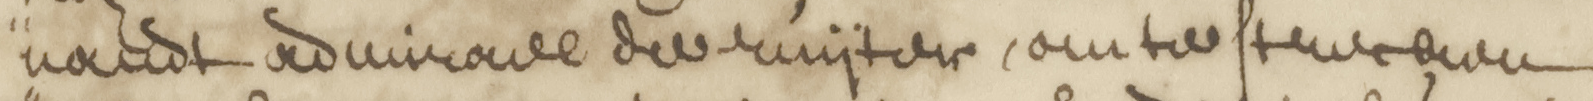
,,nandt admirael de ruijter, om te strecken
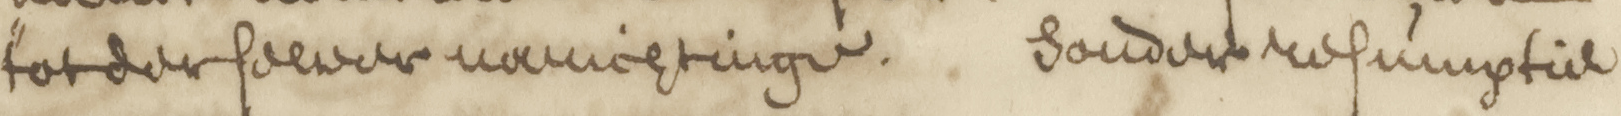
totderselver narichtinge. Sonder resumptie.
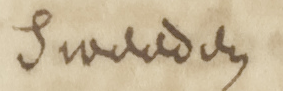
Sweeden
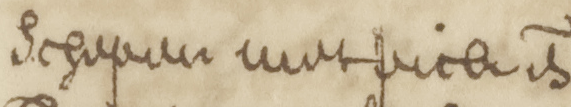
Schepen met pick en
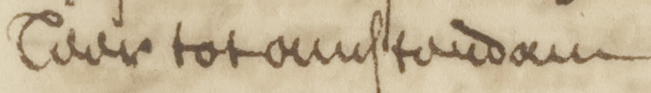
Teer tot amsterdam
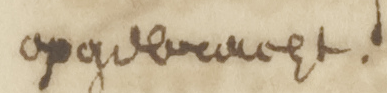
opgebracht.
